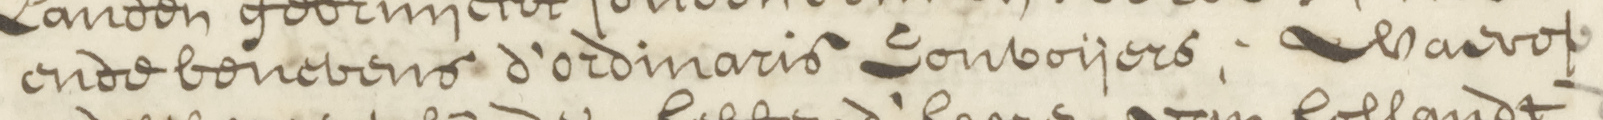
ende benevens d' ordinaris Convoijers; Waerop
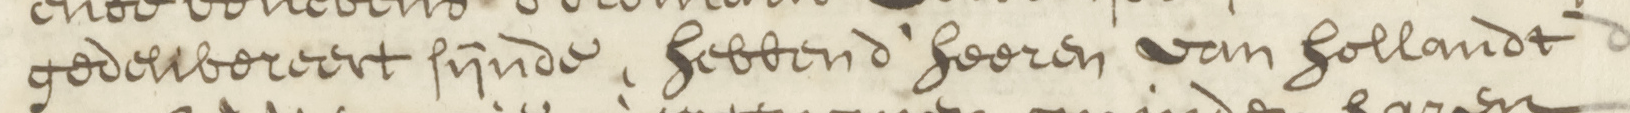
gedelibereert sijnde, hebben d' heeren van hollandt
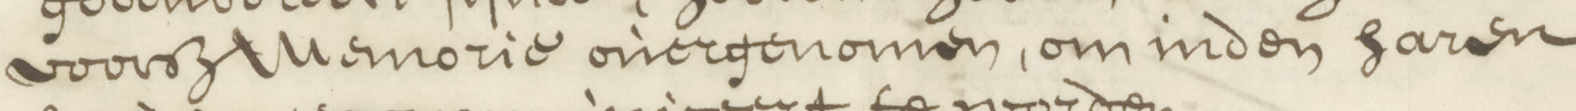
voorsz Memorie ouergenomen, om in den haren
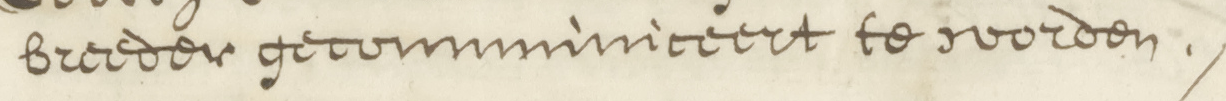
breeder gecommuniceert te worden.
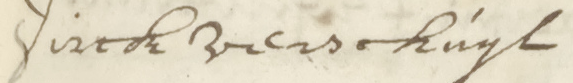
Dirck verschuyl
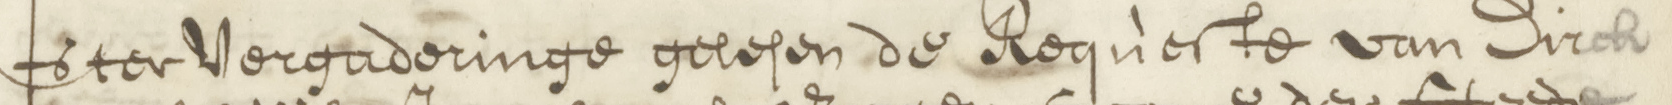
Is ter Vergaderinge gelesen de Requeste van Dirck
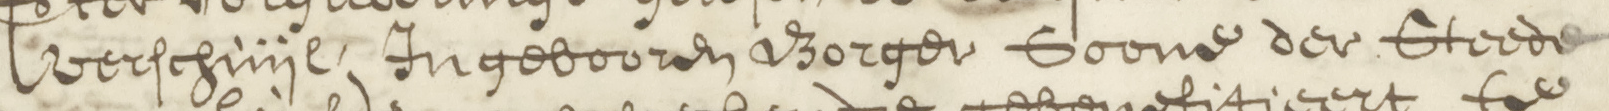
verschuijl, Ingebooren Borger Soone der Steede
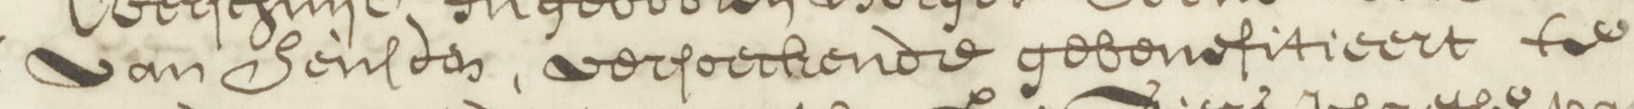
van Heusden, versoeckende gebenefitieert te
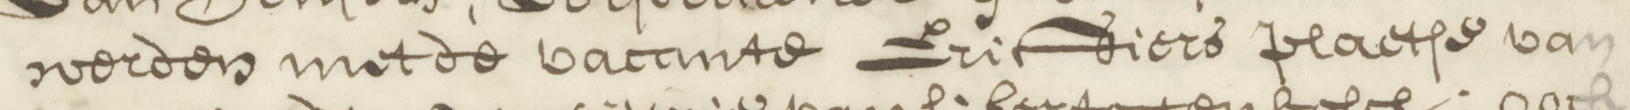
werden met de vacante Griffiers plaetse van
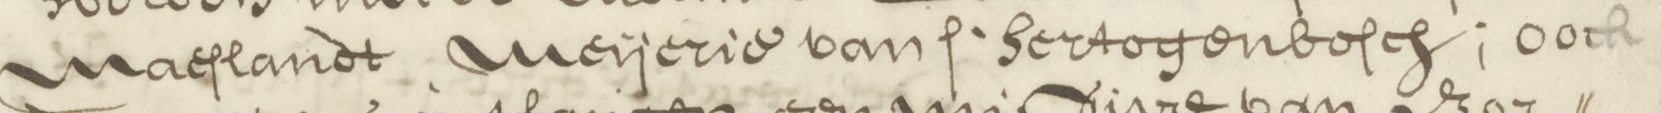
Maeslandt, Meijerie van s'hertogenbosch; oock
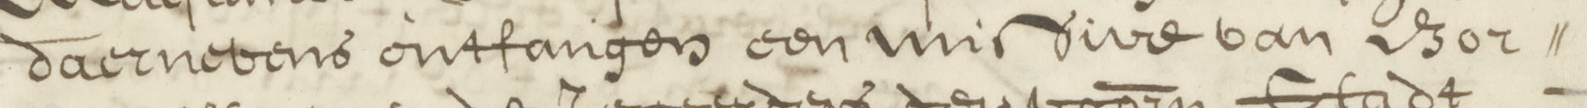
daernevens ontfangen een Missive van Bor,,
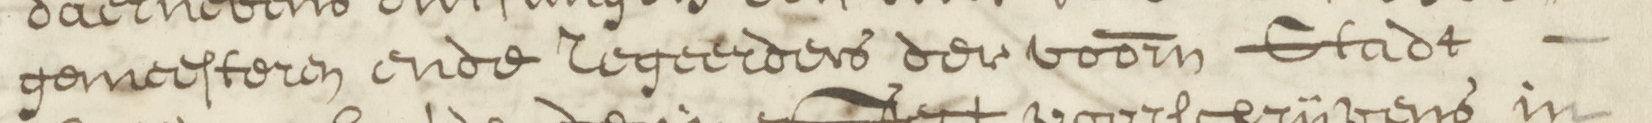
gemeesteren ende Regeerders der voorn Stadt —
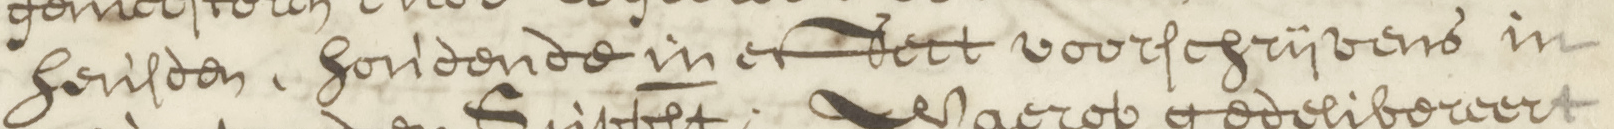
heusden, houdende in effect voorschrijvens in
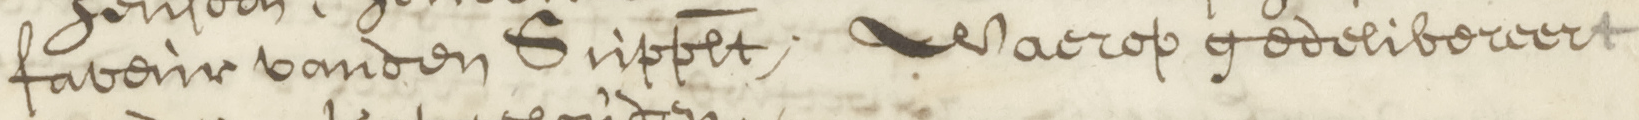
faveur vanden Supplt; Waerop gedelibereert
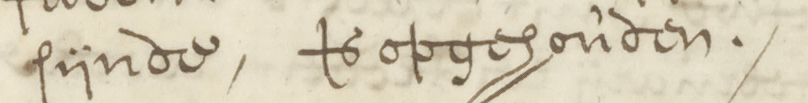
sijnde, Is opgehouden.
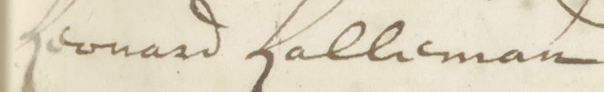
Leonard Lalleman
